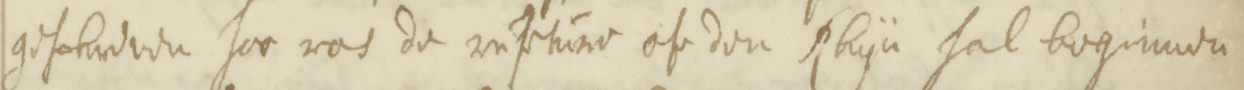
geschreven soo ras de infanterie op den Rhijn sal beginnen
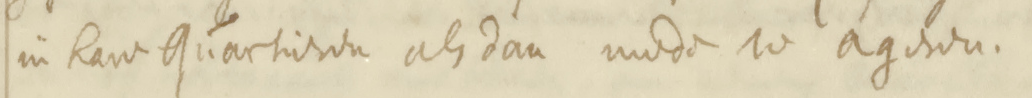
in hare quartieren als dan mede te ageren.
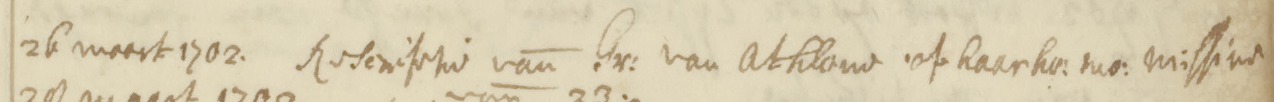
26 maart 1702. Rescriptie van Gr: van Athlone op haer ho:mo: missive
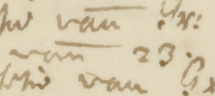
van 23.
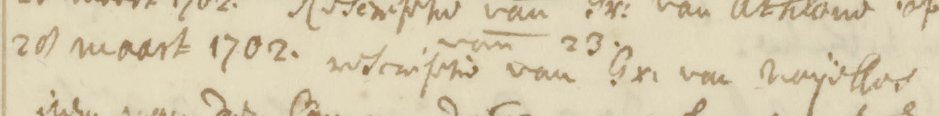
28 maart 1702. rescripti van Gr: van Noijelles
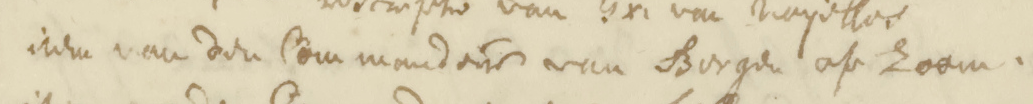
item van den Commandeur van Bergen op Zoom.
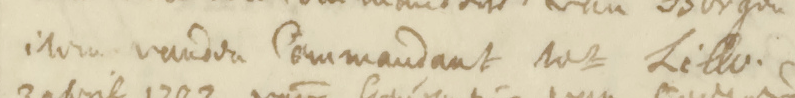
item vanden Commandant tot Lillo.
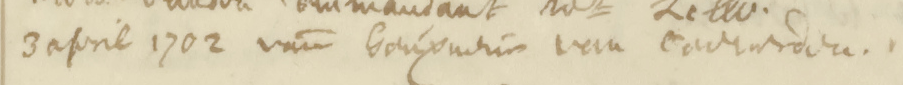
3 april 1702 van gouvneur van Coeverden.
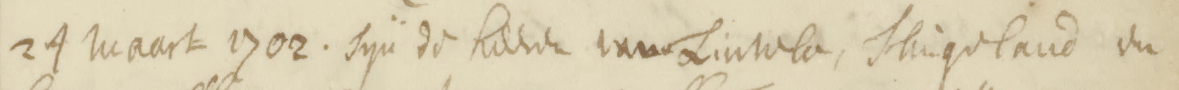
24 maart 1702. sijn de heeren van Lintelo, Slingeland en
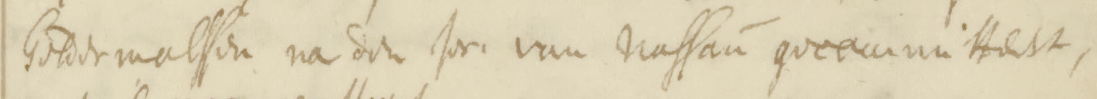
Geldermalssen na den Pr. van Nassau gecommitteert.
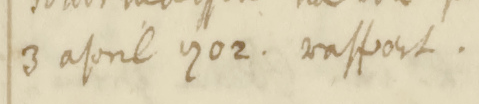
3 april 1702. rapport.
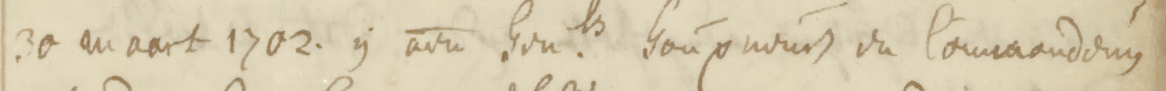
30 maert 1702. is aen Genls. Gouvneurs en Commandeurs
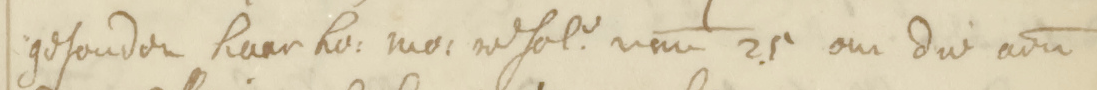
gesonden haer ho:Mo: resole. van 25 om die aen
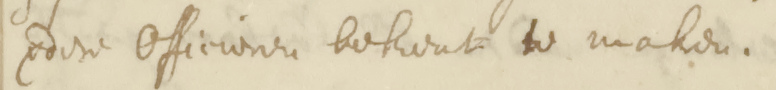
vdere Officleren bekent te maken.
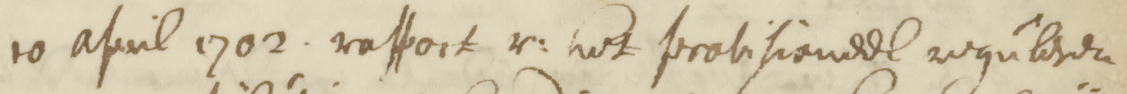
10 april 1702. rapport r: het provisioneel reguleren
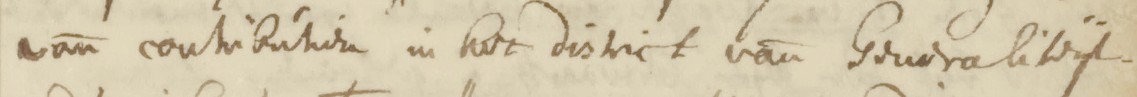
van contributien in het district van Generaliteijt
